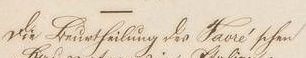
Die Beurtheilung des Favre'schen
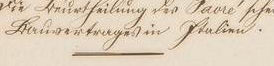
Bauvertrages in Italien.
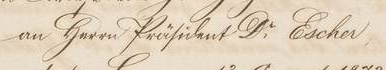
an Herrn Präsident Dr Escher
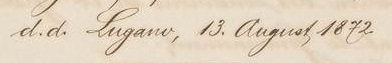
d. d. Lugano, 13. August 1872
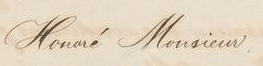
Honoré Monsieur.
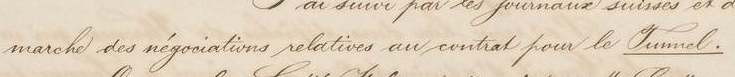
marche des négociations relatives au contrat pour le Tunnel.
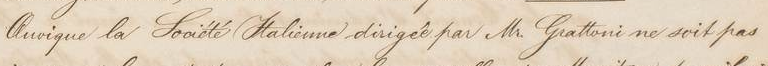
Quoique la Société Italienne dirigée par M. Grattoni ne soit pas
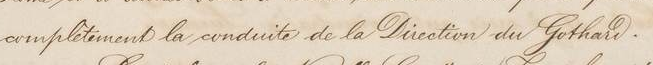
complètement la conduite de la Direction du Gothard.
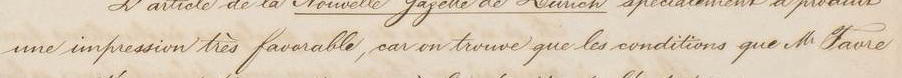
une impression trés favorable, car on trouve que les conditions que M Favre
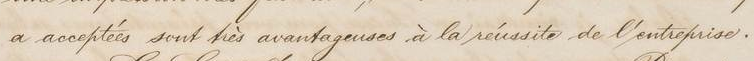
a acceptées sond très avantageuses à la réussite de l'entreprise.
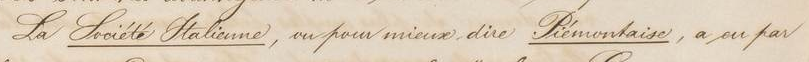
La Société Italienne, ou pour mieux dire Piémontaise,a eu par
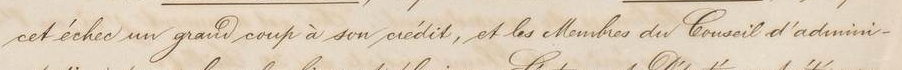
cet échec un grand coup à son crédit, et les Membres du Conseil d'admini-
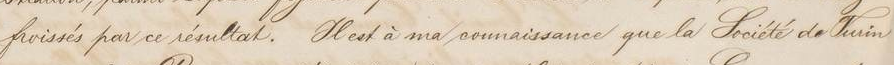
froissés par ce résultat. Il est à ma connaissance que la Société de Turin
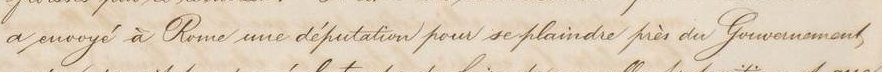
a envoyé à Rome une députation pour se plaindre près du Gouvernement,
